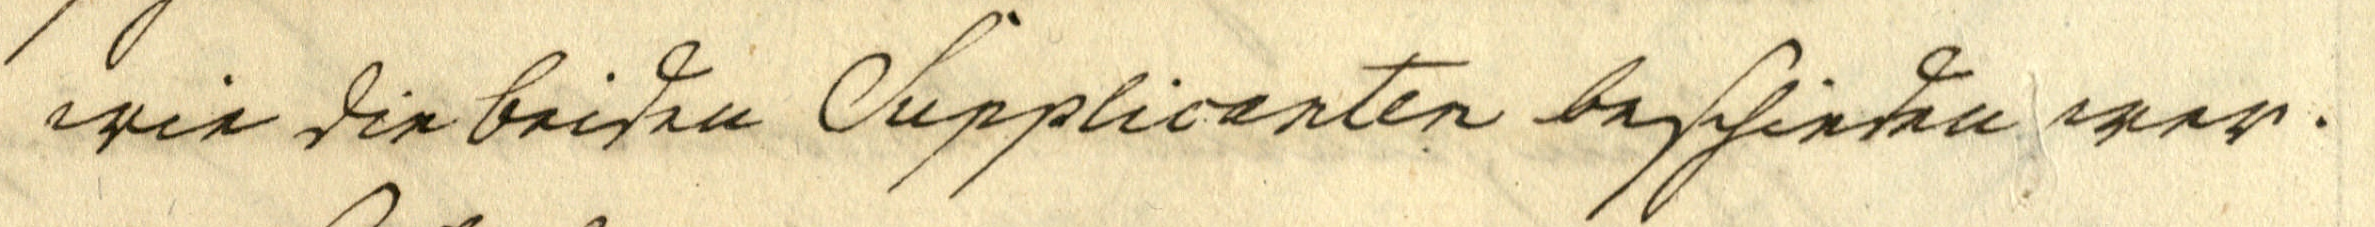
wie die beiden Supplicanten beschieden wer-
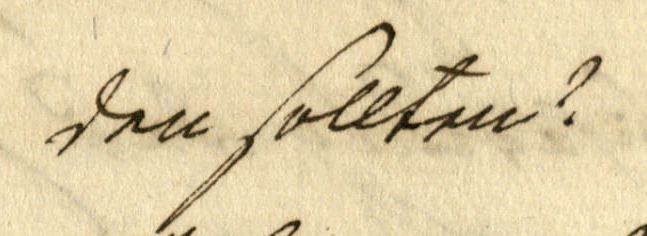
den sollten?
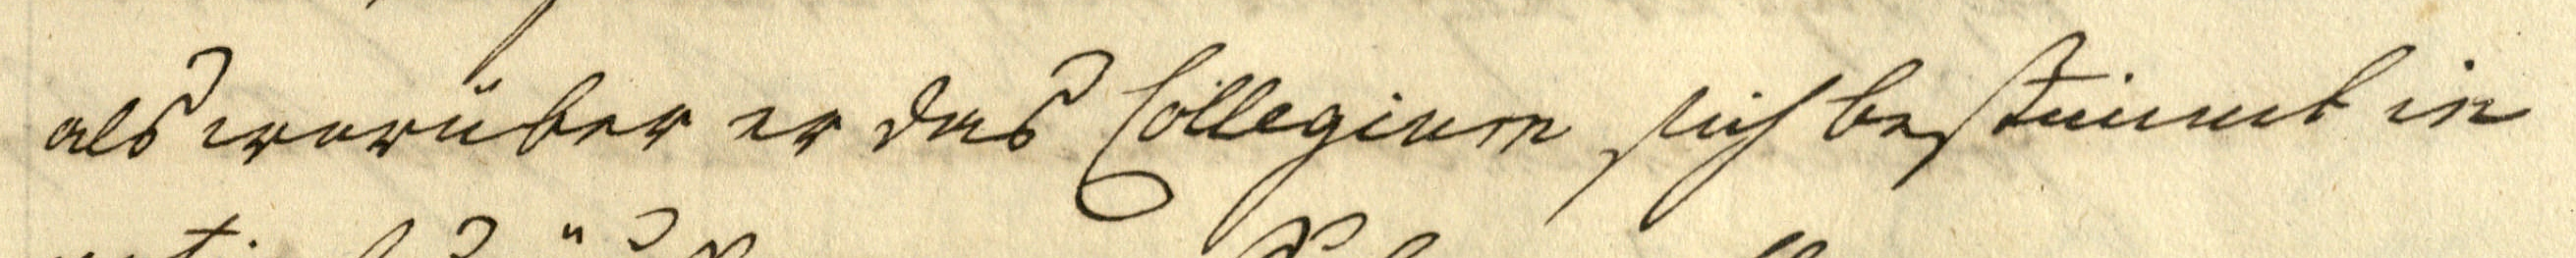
Als worüber er das Collegium sich bestimmt in
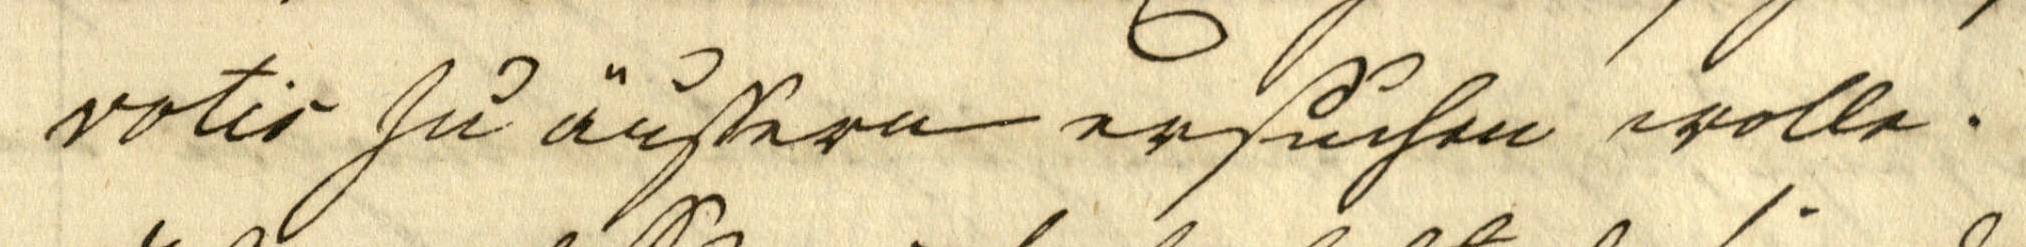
votis zu äussern ersuchen wolle.
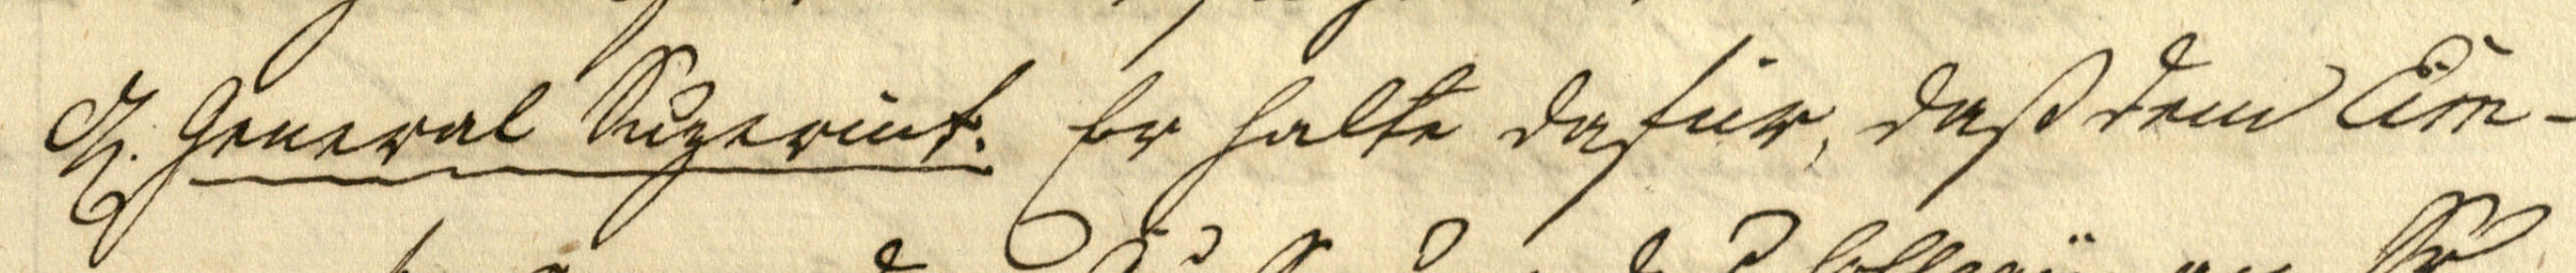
dh. General Superint. Er halte dafür, daß dem Eim-
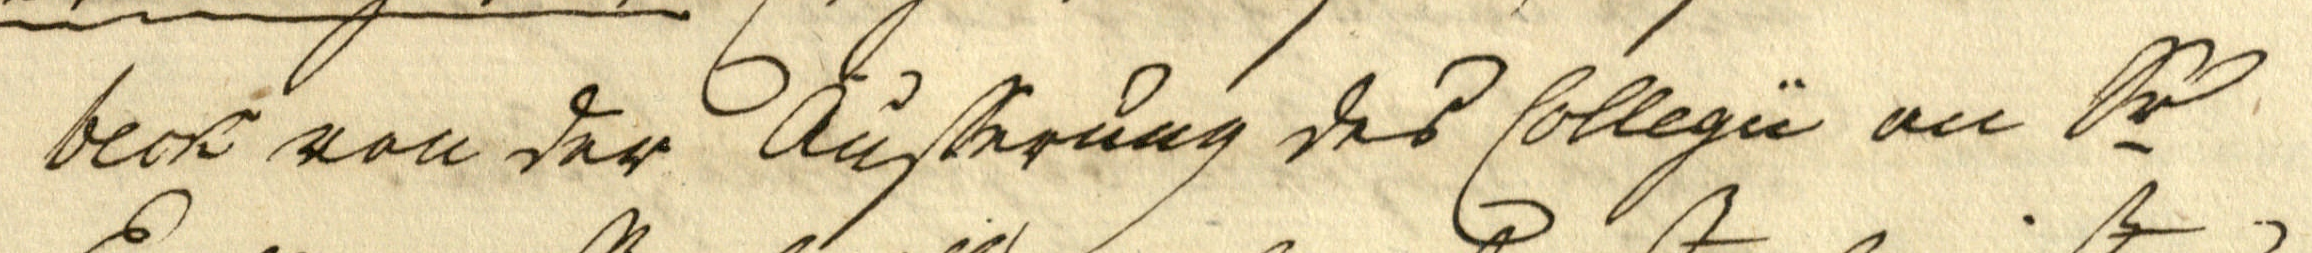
beck von der Äusserung des Collegii an Sr.
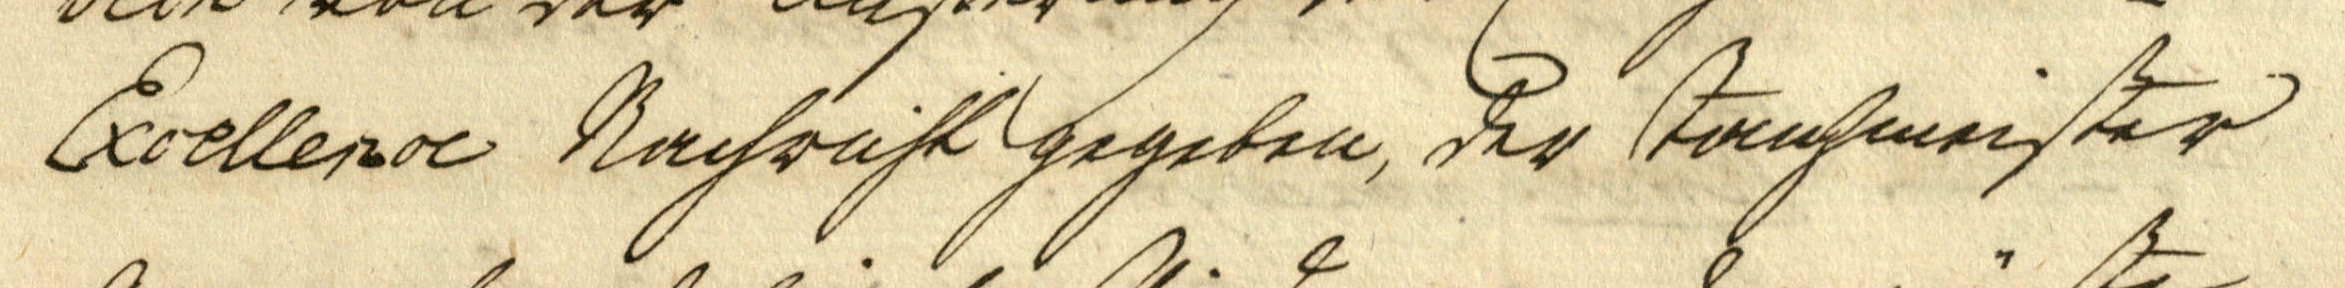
Excellence Nachricht gegeben, der Tanzmeister
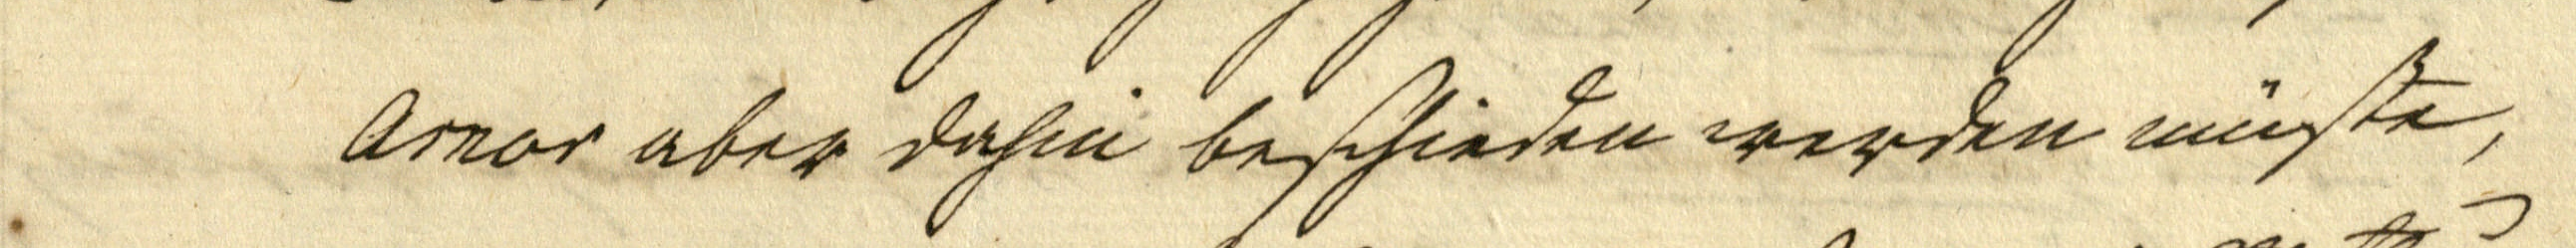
Amor aber dahin beschieden werden müßte,
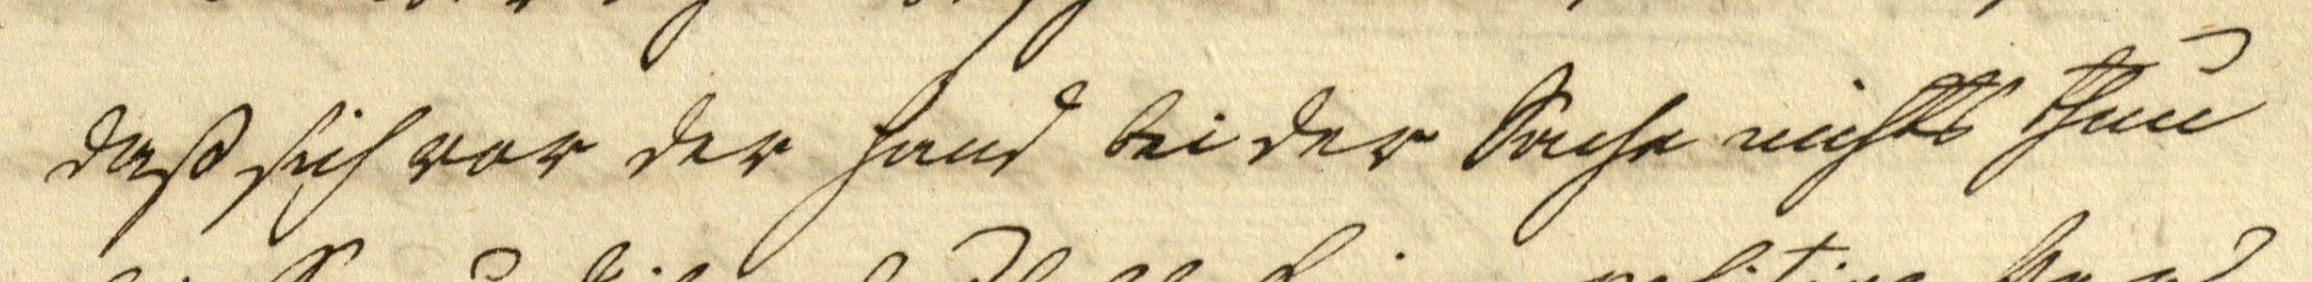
daß sich vor der hand bei der Sache nichts thun
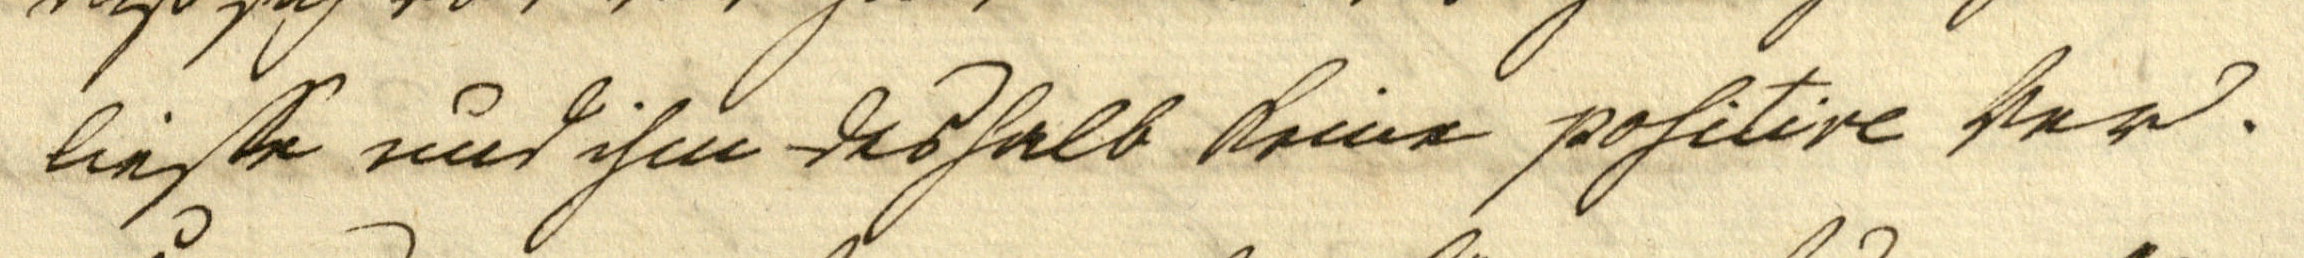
liesse und ihm deshalb keine positive Ver-
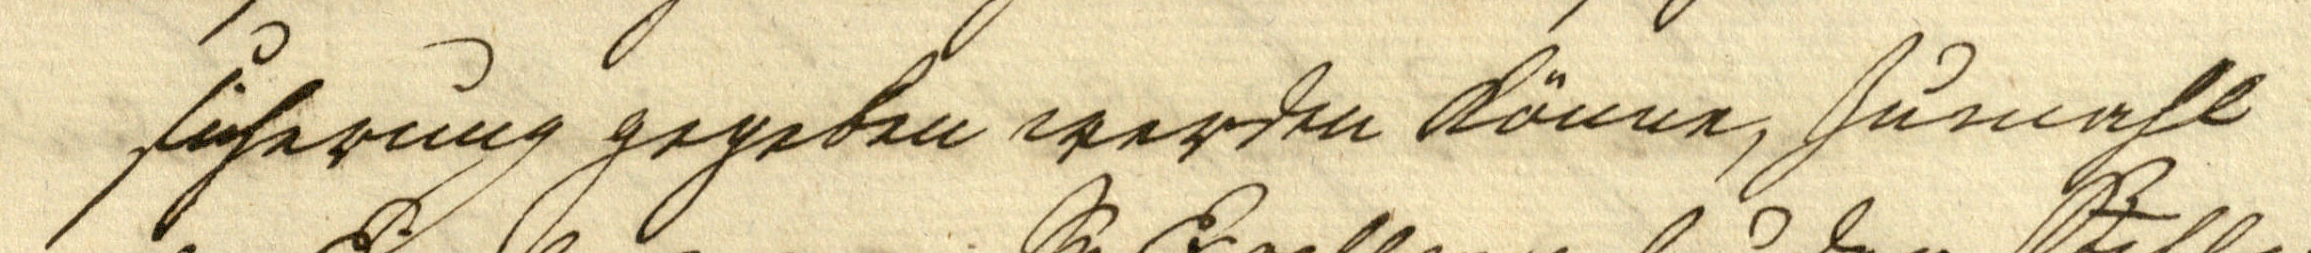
sicherung gegeben werden könne, zumahl
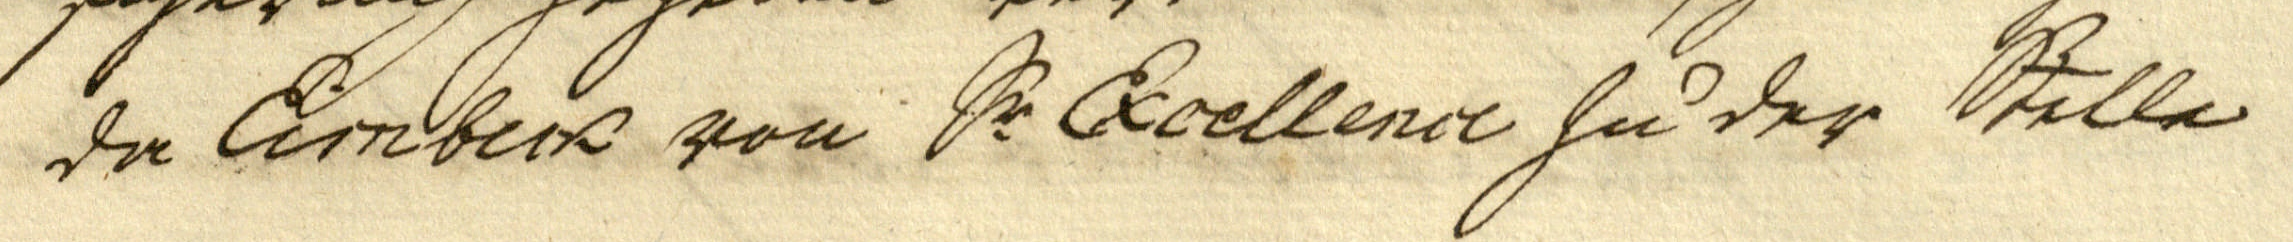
da Eimbeck von Sr. Excellence zu der Stelle
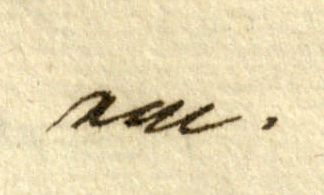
em-
